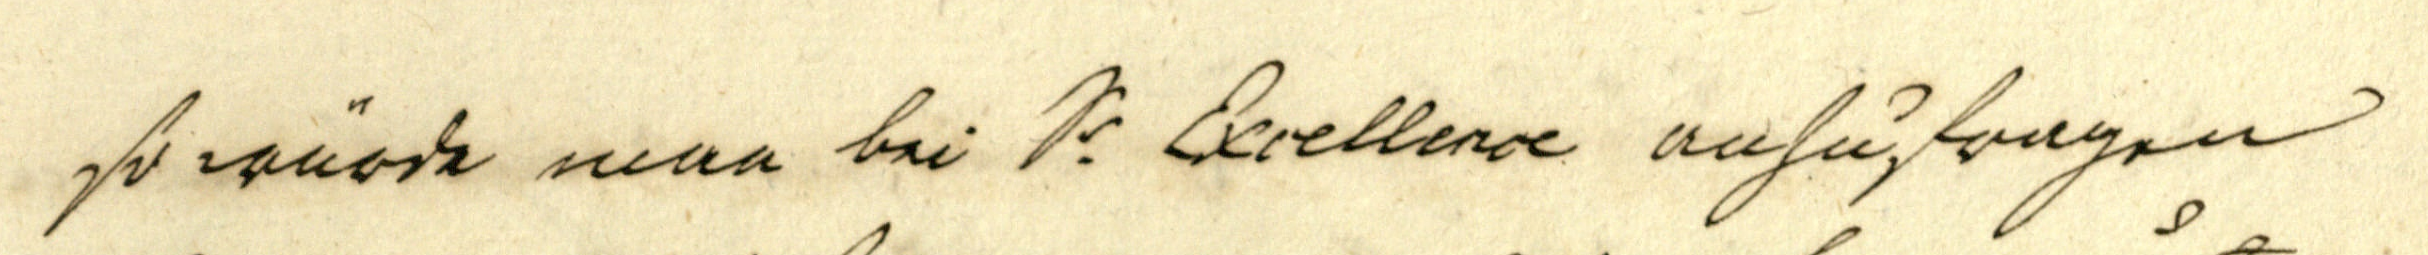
so würde man bei Sr Excellence anzufragen
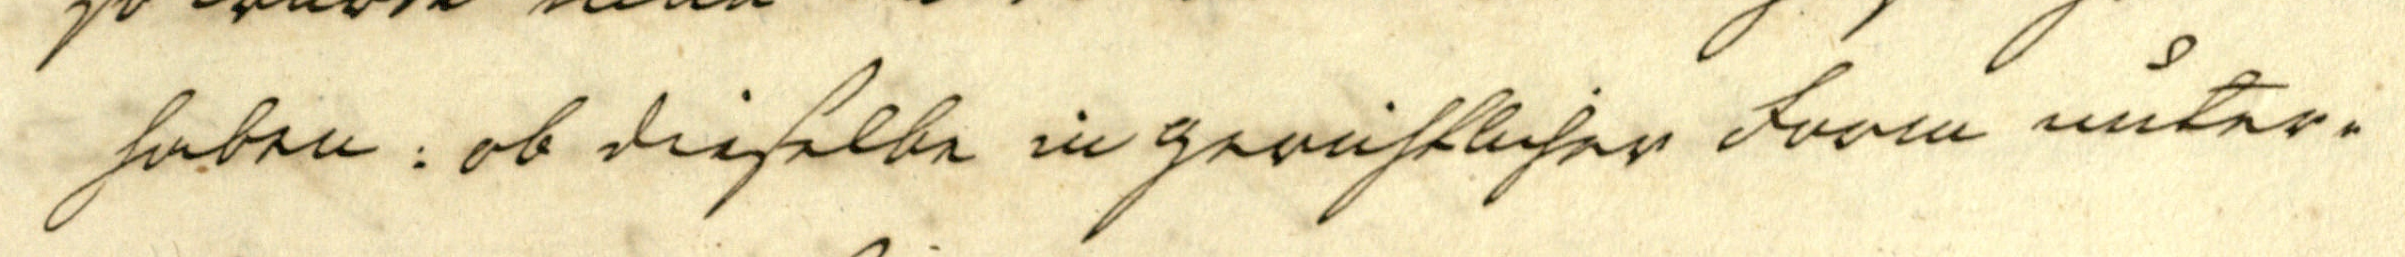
haben: ob dieselbe in gerichtlicher Form unter¬
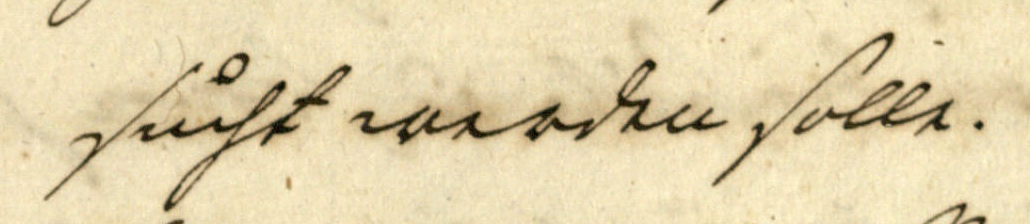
suchte werden solle.
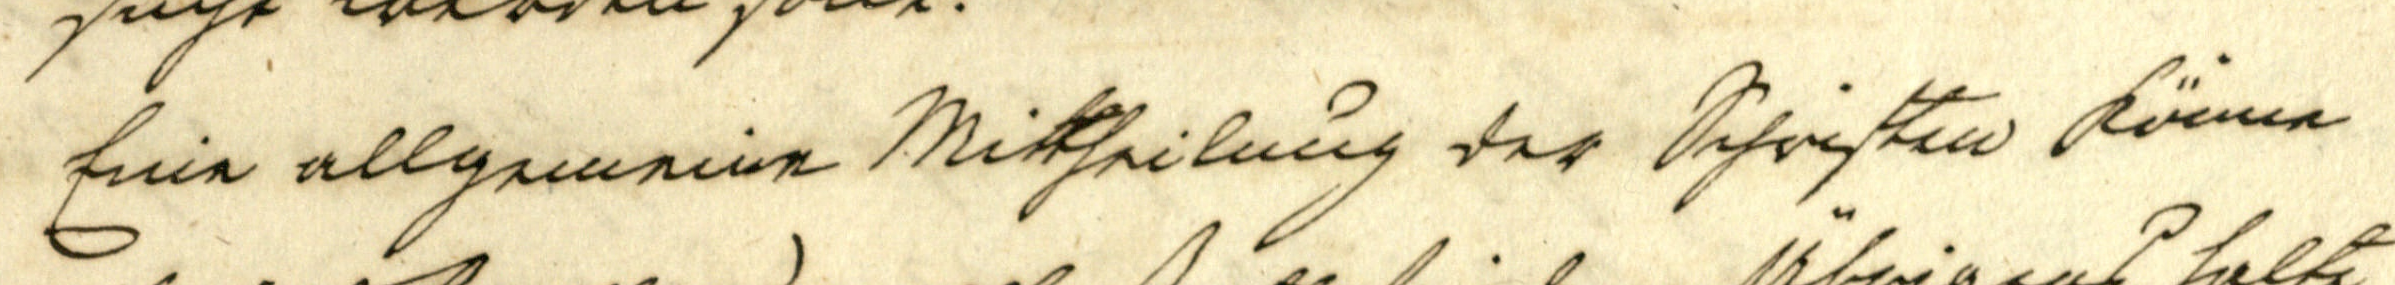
Eine allgemeine Mittheilung der Schriften könne
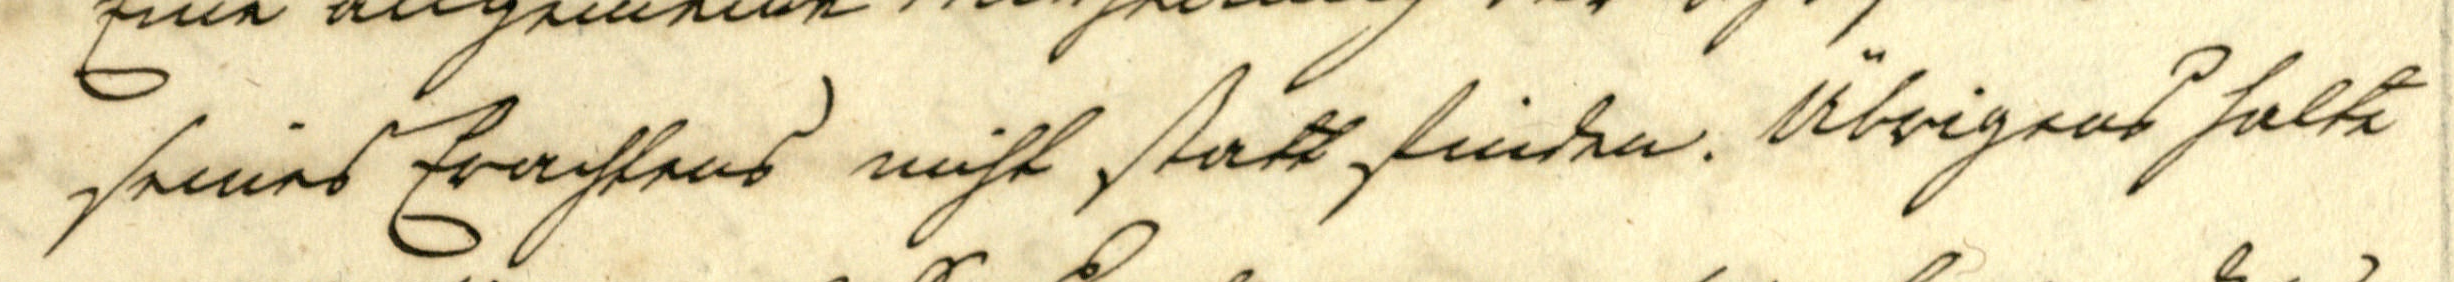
seines Erachtens nicht statt finden. Übrigens halte
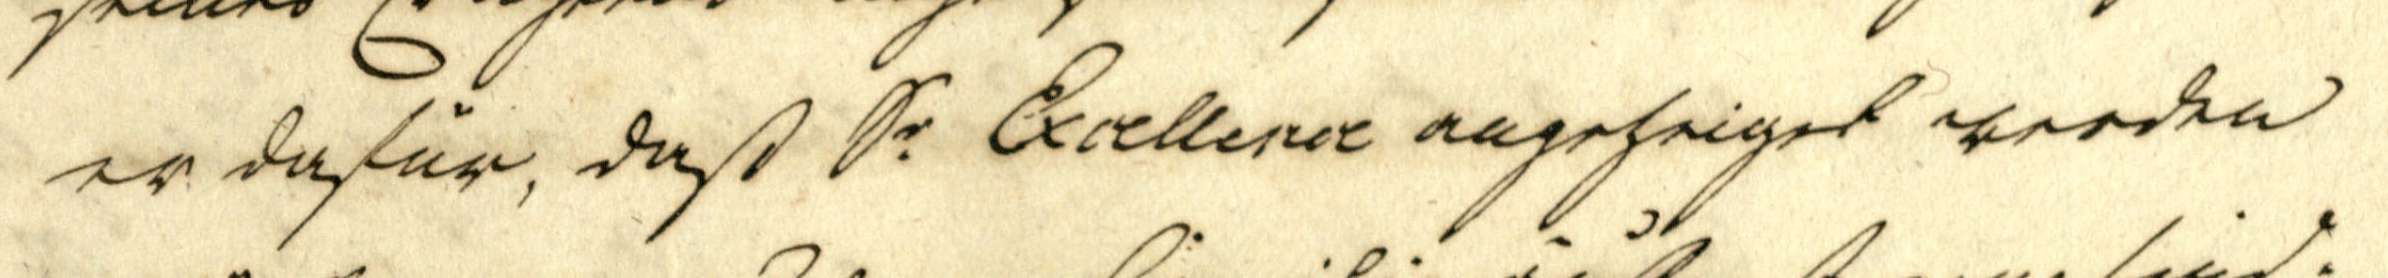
er dafür, daß Sr Excellence angezeiget werden
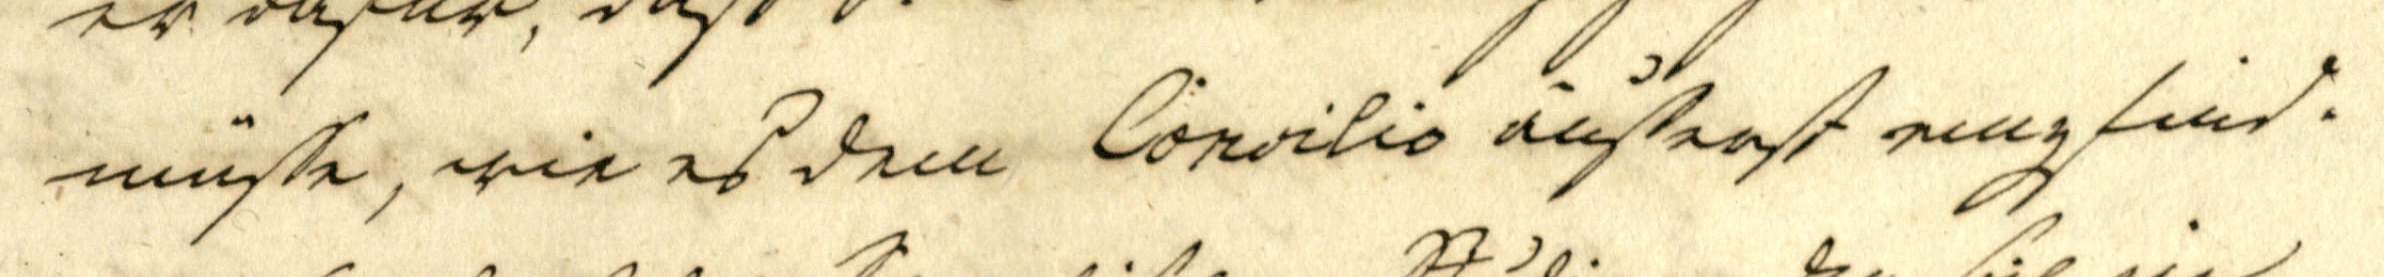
müsse, wie es dem Concilio äusserst empfind¬
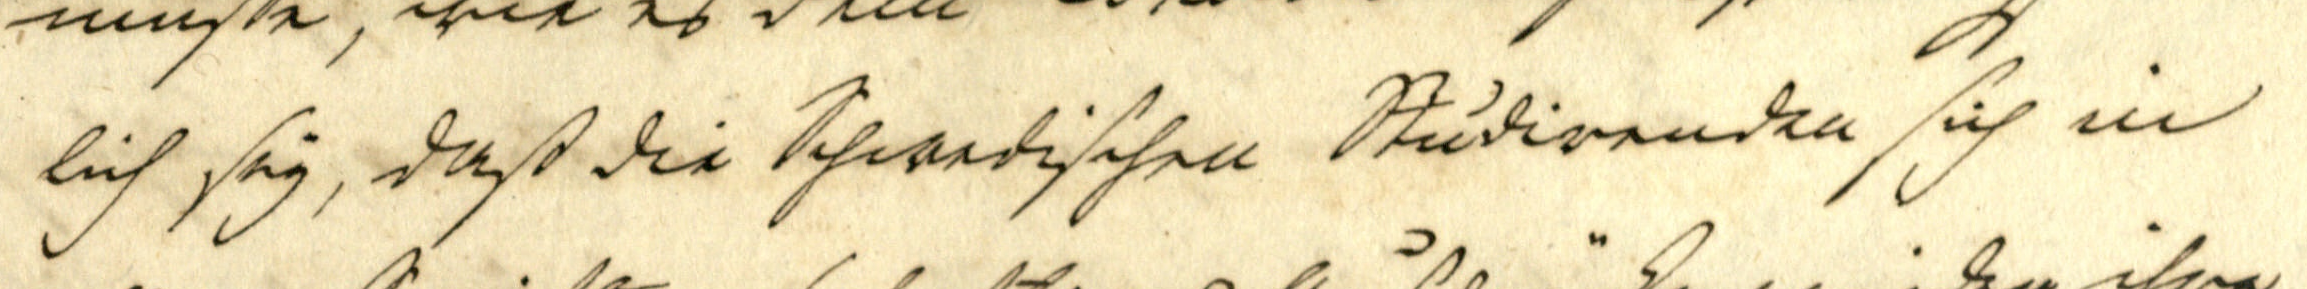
lich seÿ, daß die Schwedischen Studirenden sich in
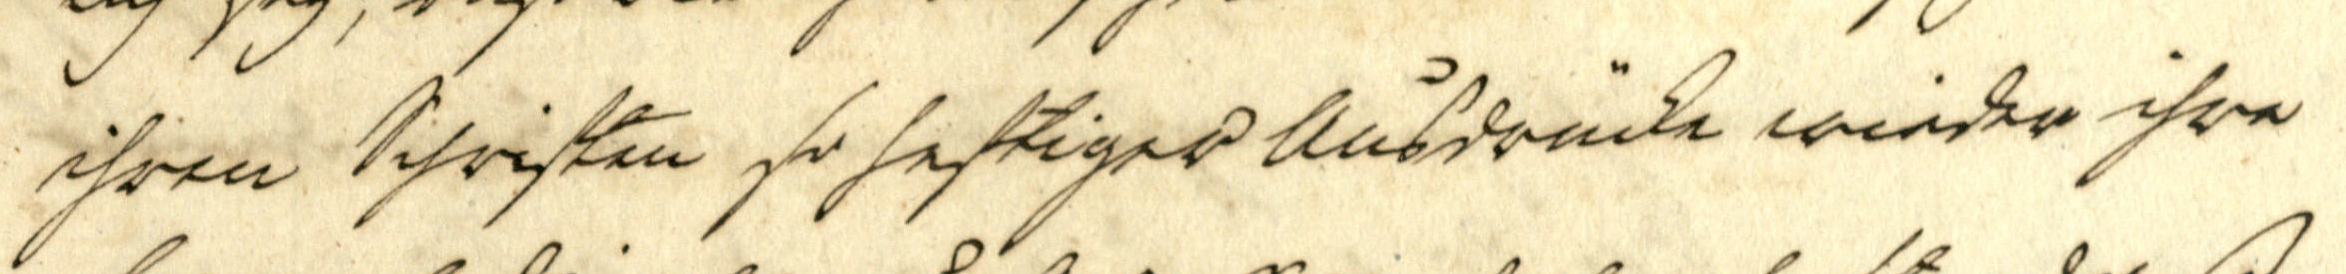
ihren Schriften so heftiger Ausdrücke wieder ihre
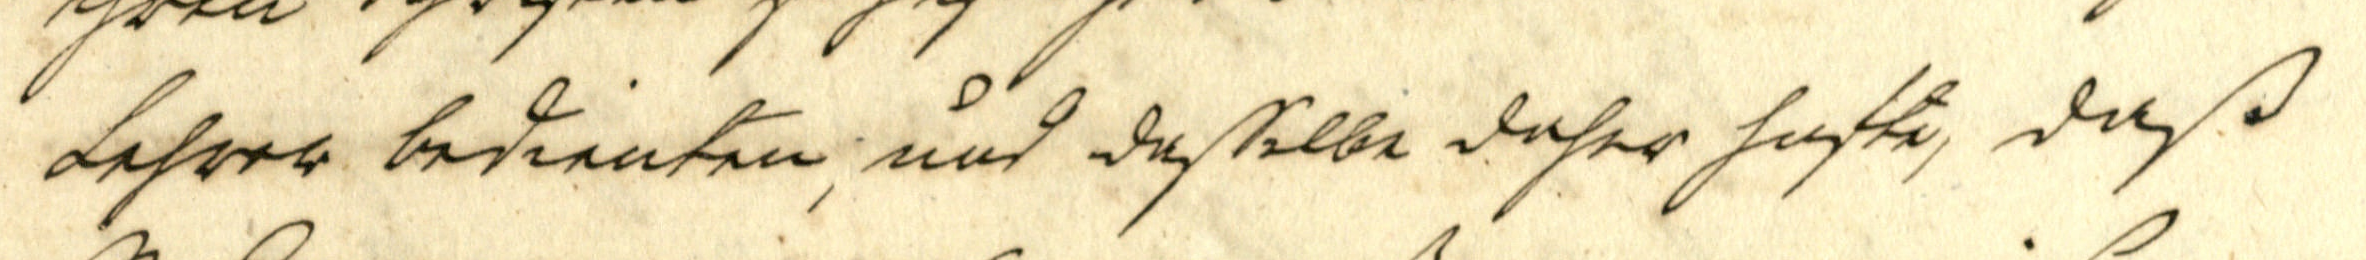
Lehrer bedienten, und dasselbe daher hofte, daß
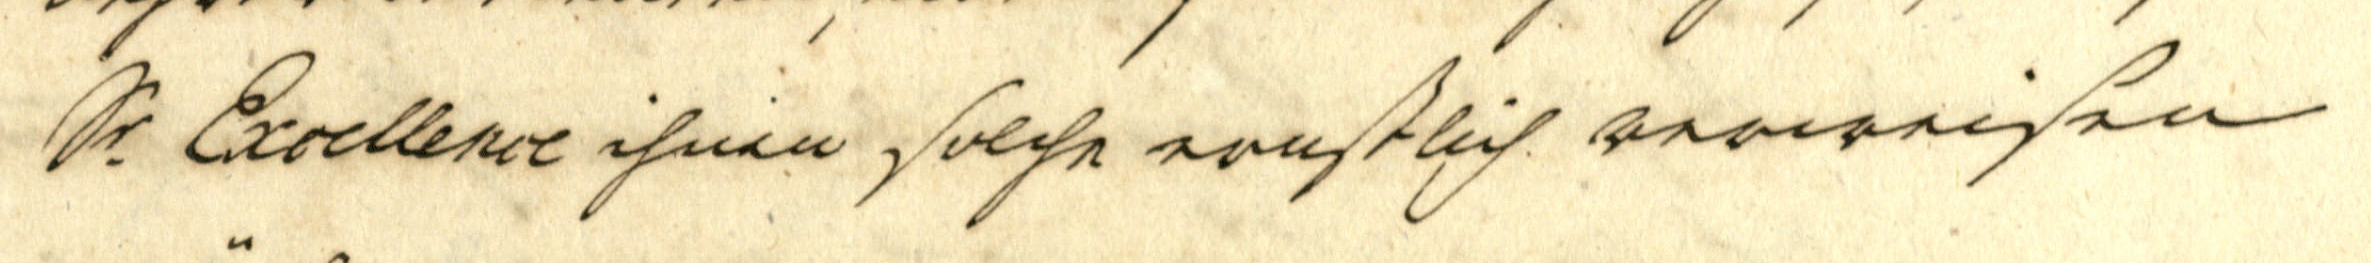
Sr Excellence ihnen solche ernstlich verweisen
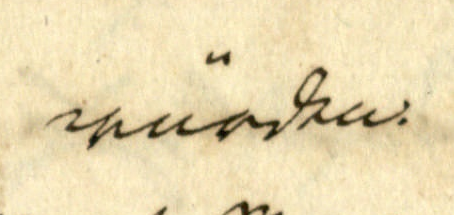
würden.
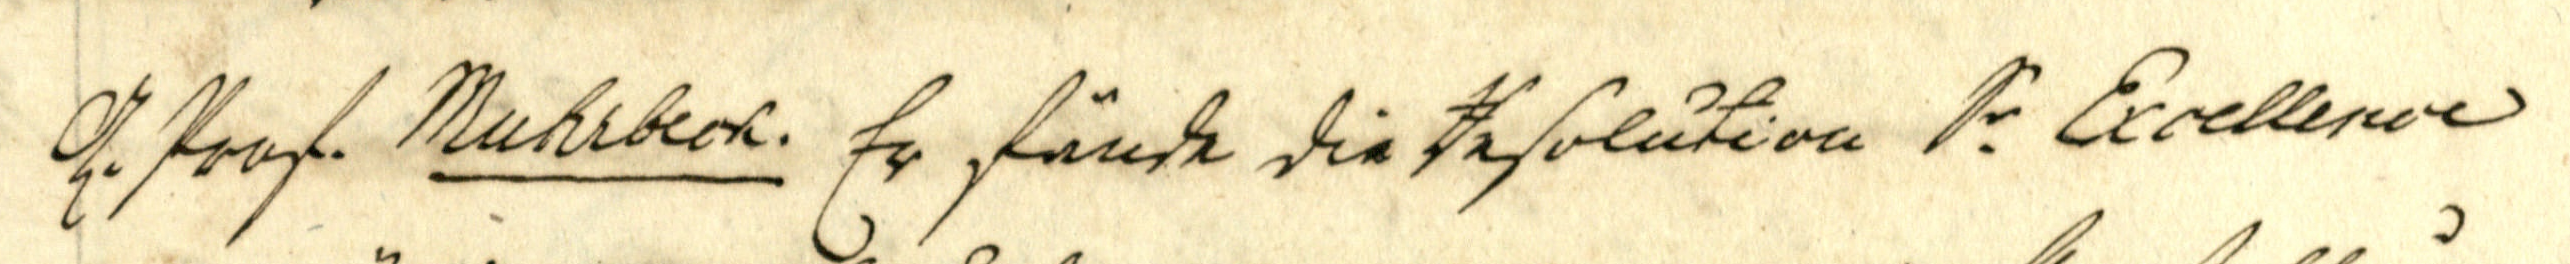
dh. Prof. Muhrbeck. Er fände die Resolution Sr Excellence
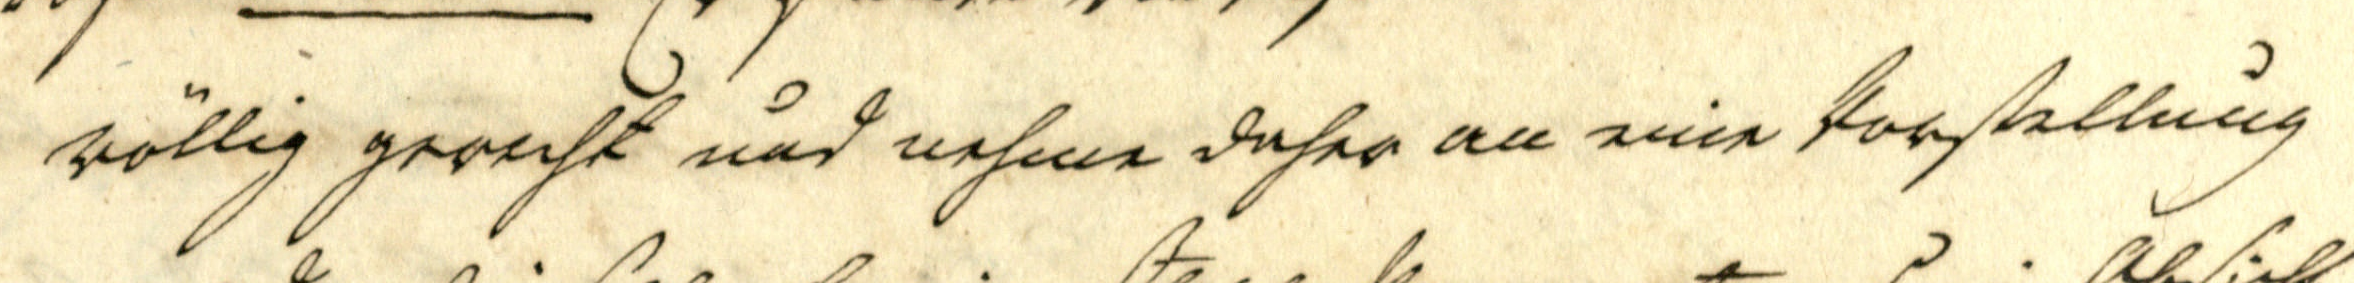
völlig gerecht und nehme daher an eine Vorstellung
